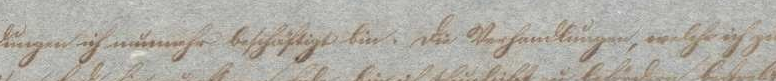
redungen ich nunmehr beschäftigt bin. Die Verhandlungen, welche ich zu
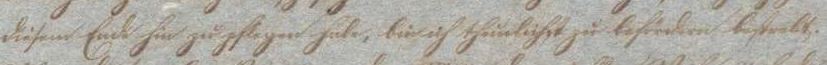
diesem Ende hin zu pflegen habe, bin ich thunlichst zu befördern bestrebt.
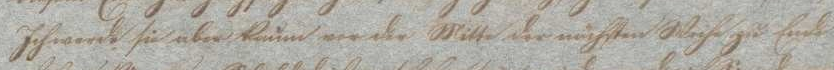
Ich werde sie aber kaum vor der Mitte der nächsten Woche zu Ende
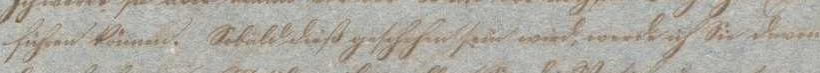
führen können. Sobald dieß geschehen sein wird, werde ich Sie davon
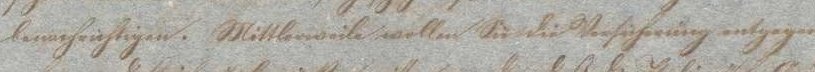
benachrichtigen. Mittlerweile wollen Sie die Versicherung entgegen-
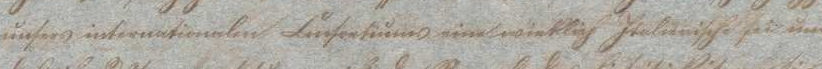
unsers internationalen Consortiums eine wirklich Italienische sei und
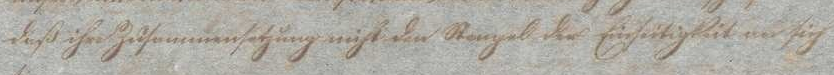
daß ihre Zusammensetzung nicht den Stempel der Einseitigkeit an sich
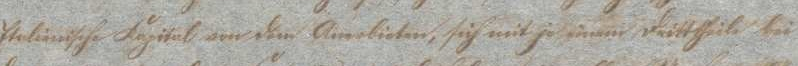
Italienische Kapital von dem Anerbieten, sich mit je einem Dritttheile bei
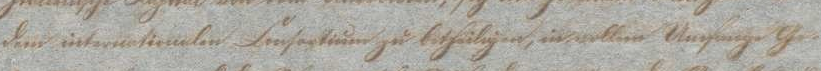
dem internationalen Consortium zu betheiligen, in vollem Umfange Ge-
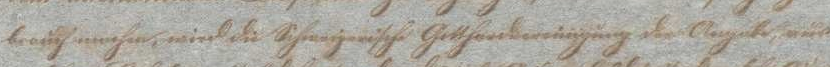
brauch machen, wird die Schweizeische Gotthardvereinigung der Angabe, aus
